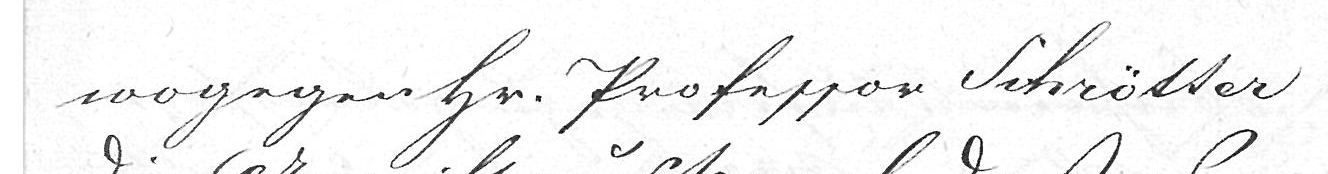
wogegen Hr. Professor Schrötter
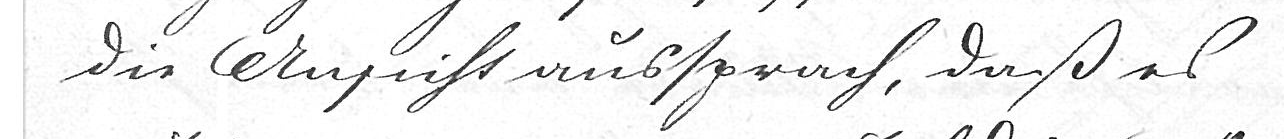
die Ansicht aussprach, daß es
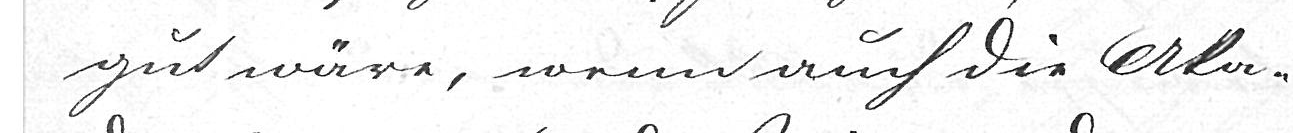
gut wäre, wenn auch die Aka-
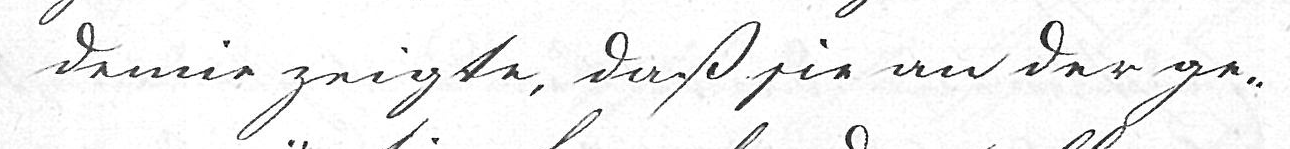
demie zeigte, daß sie an der ge-
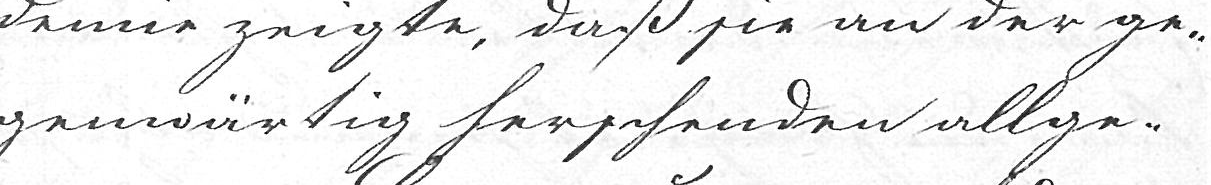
enwärtig herrschenden allge-
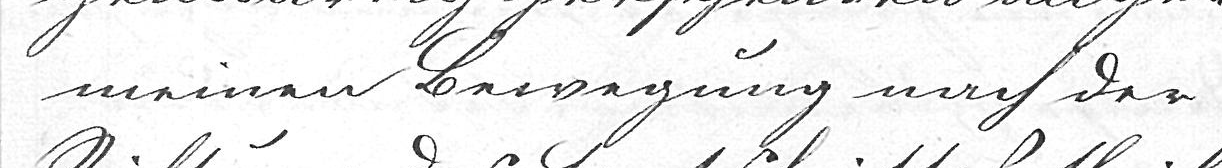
meinen Bewegung nach der
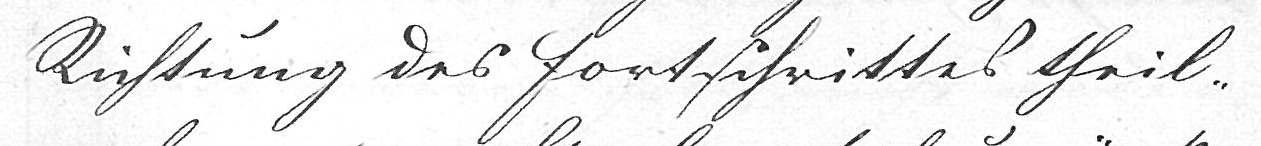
Richtung des Fortschrittes theil-
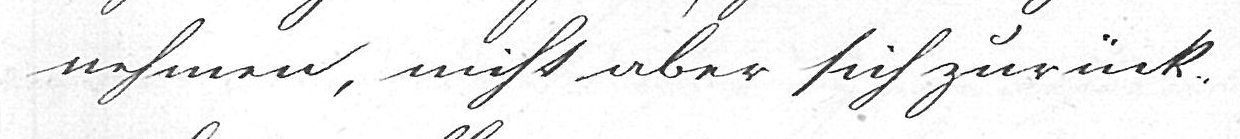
nehmen, nicht aber sich zurück-
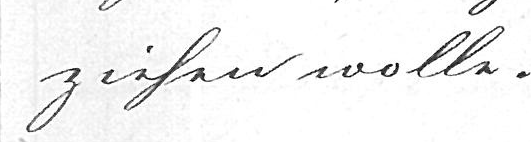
ziehen wolle.
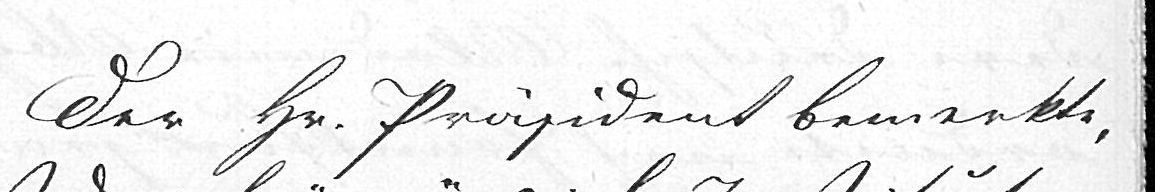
Der Hr. Präsident bemerkte,
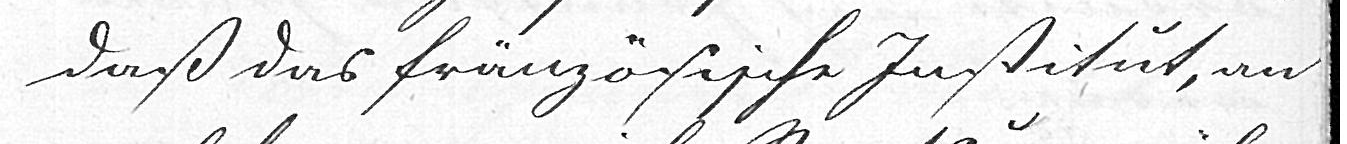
daß das fränzosische Institut, an
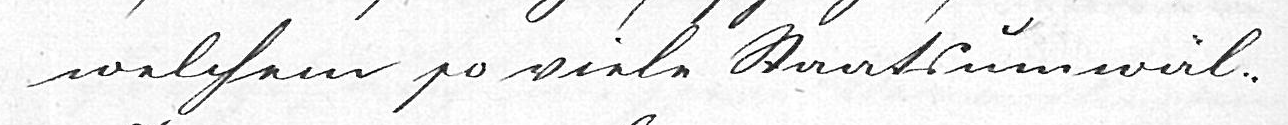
welchem so viele Staatsumwäl-
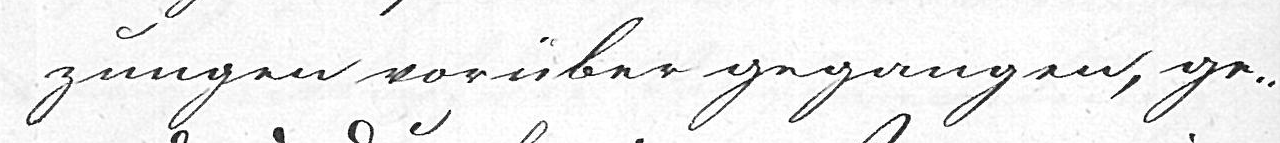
zungen vorüber gegangen, ge-
